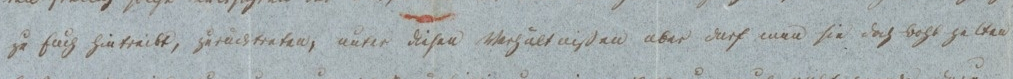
zu Euch hintreibt, zurücktreten, unter diesen Verhältnißen aber darf man sie doch wohl gelten
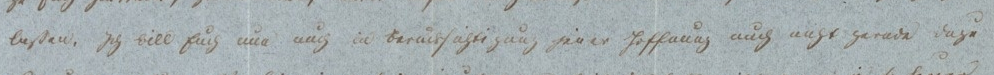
lassen. Ich will Euch nun auch in Berücksichtigung jener Hoffnung auch nicht gerade dazu
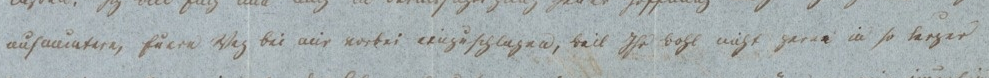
aufmuntern, Euern weg bei mir vorbei einzuschlagen, weil Ihr wohl nicht gerne in so kurzer
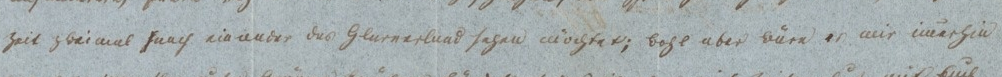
Zeit zweimal nach einander das Glarnerland sehen möchtet; wohl aber wäre es mir immerhin
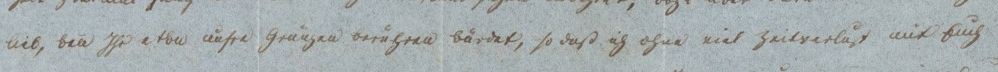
lieb, wenn Ihr etwas unsre Gränzen berühren würdet, so daß ich ohne viel Zeitverlust mit Euch
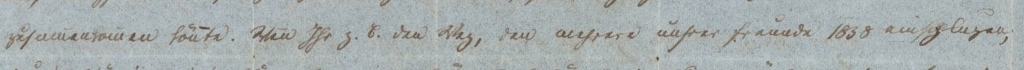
zusammenkommen könnte. Wenn Ihr z. B. den Weg, den mehrere unsrer Freunde 1838 einschlugen,
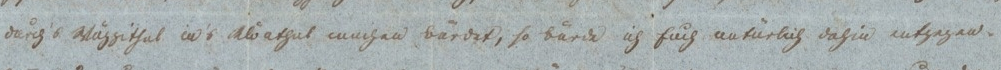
durch's Wäggithal in's Klönthal machen würdet, so würde ich Euch natürlich dahin entgegen-
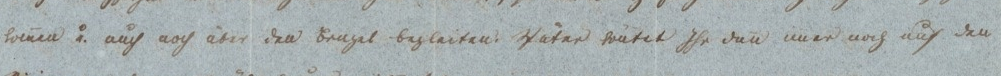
kommen u. auch noch über den Bragel begleiten. Später könntet Ihr dann immer noch auf den
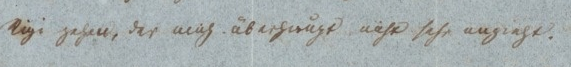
Rigi gehen, der mich überhaupt nicht sehr anzieht.
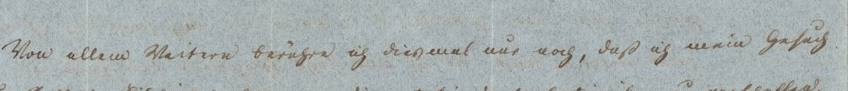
Von allem Weitern berühre ich diesmal nur noch, daß ich mein Gesuch
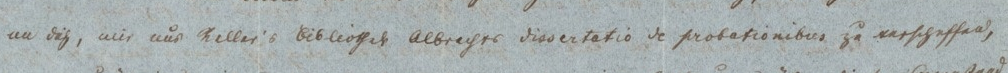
an dich, mir aus Keller's Bibliothek Albrechts Dissertatio de probationibus zu verschaffen,
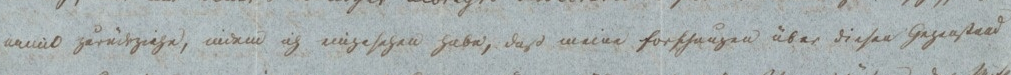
anmit zurückziehe, indem ich eingesehen habe, daß meine Forschungen über diesen Gegenstand
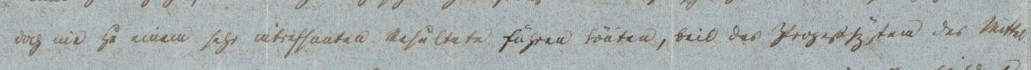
doch nie zu einem sehr intressanten Resultate führen könnten, weil das Prozeßsystem des Mittel-
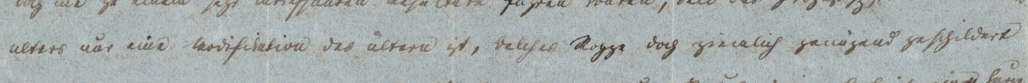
alters nur eine Modifikation des ältern ist, welches Rogge doch ziemlich genügend geschildert
